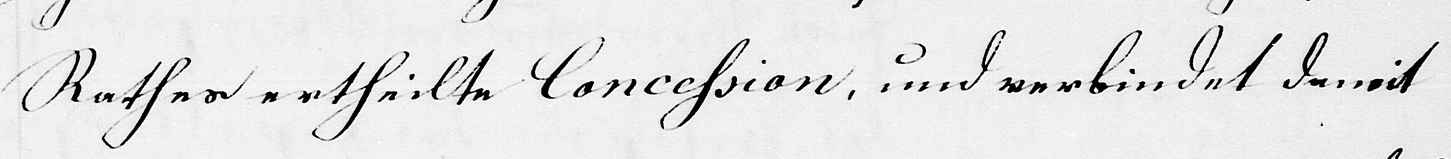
Rathes ertheilte Concession, und verbindet damit
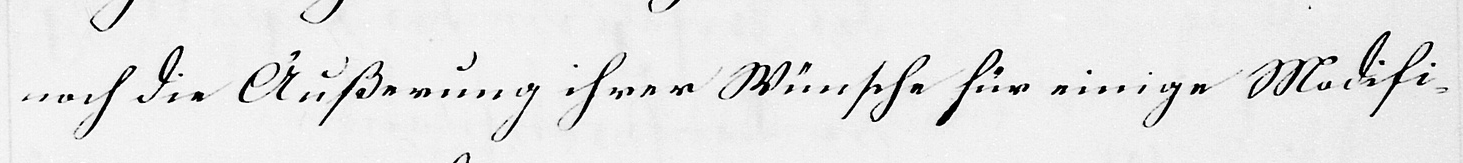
noch die Äußerung ihrer Wünsche für einige Modifi¬
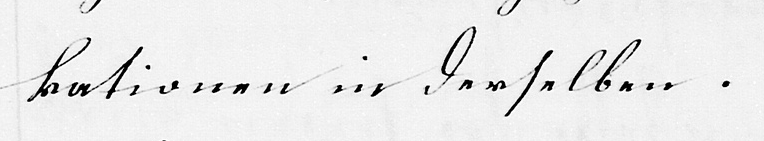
kationen in derselben.
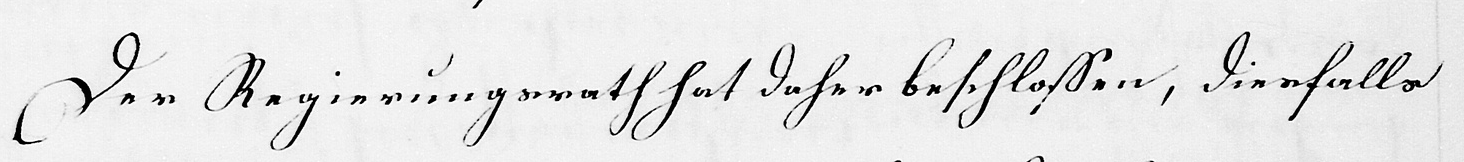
Der Regierungsrath hat daher beschloßen, diesfalls
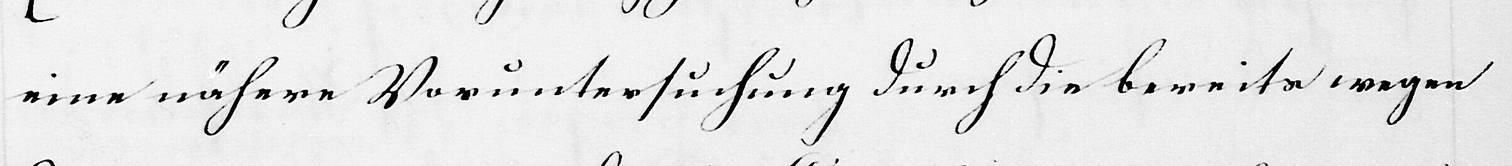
eine nähere Voruntersuchung durch die bereits wegen
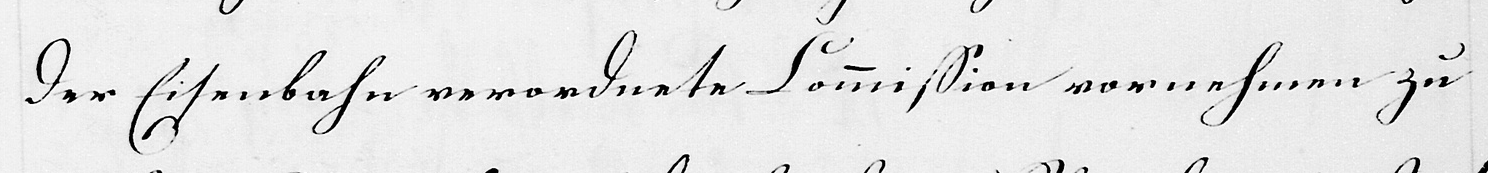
der Eisenbahn verordnete Commißion vornehmen zu
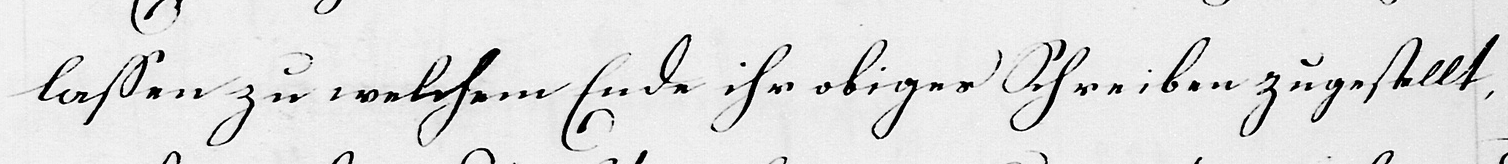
laßen zu welchem Ende ihr obiges Schreiben zugestellt
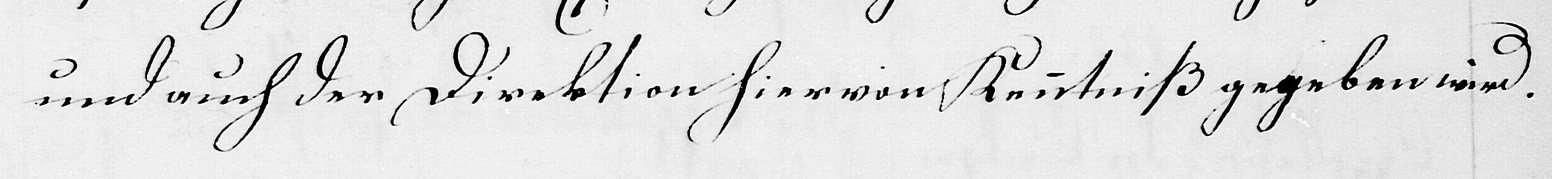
und auch der Direktion hiervon Kenntniß gegeben wird.
